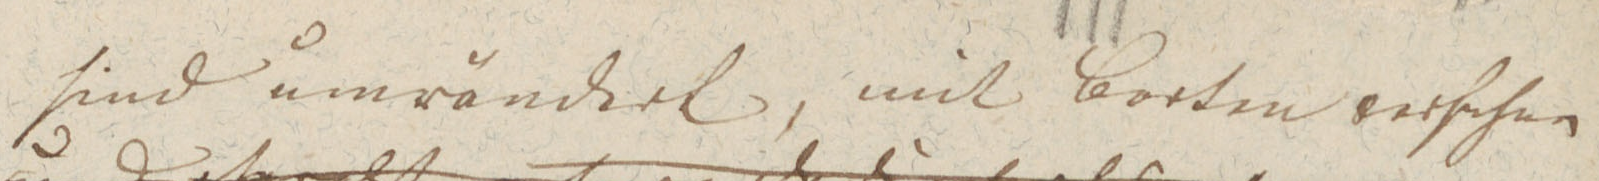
sind umrändert, mit Borten versehen
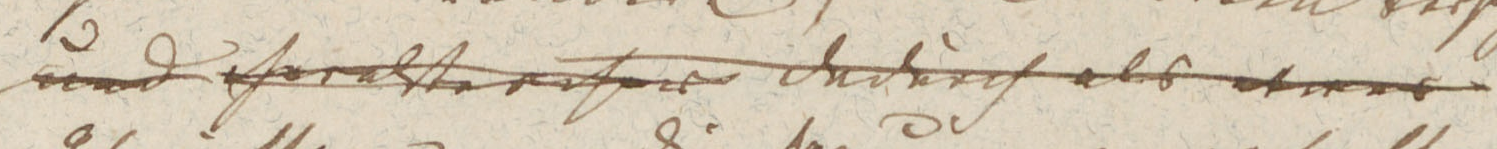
und charakteriser dadurch als etwas
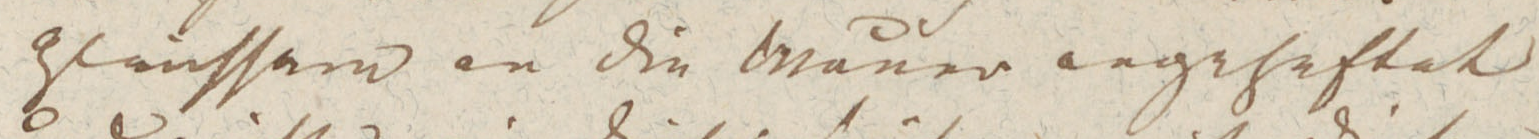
gleichsam an die Mauer angeheftet
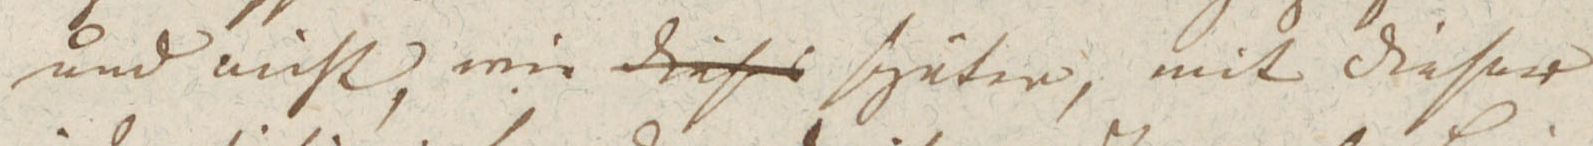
und nicht, wie dieses später, mit dieser
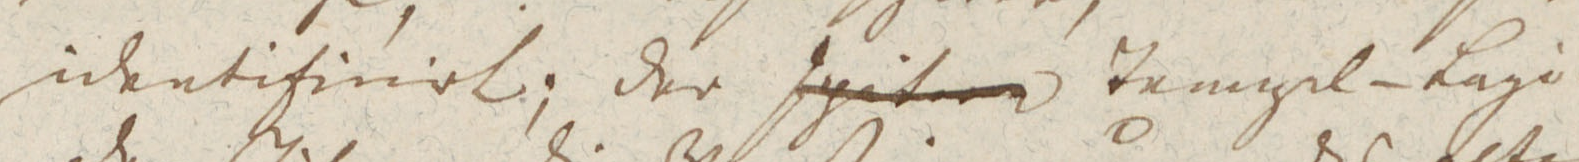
identificirt; der spätere Tempel-Lapi-
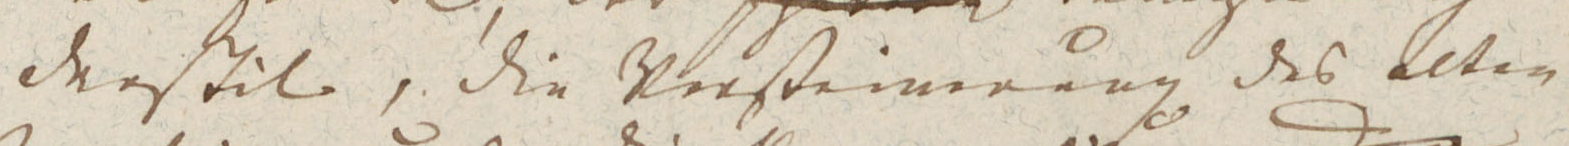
darstil, die Versteinerung des alten
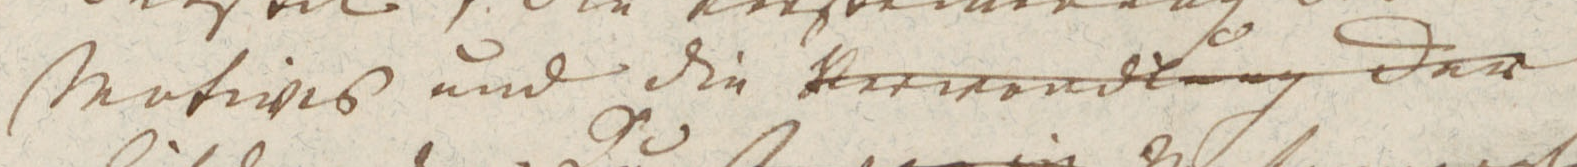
Motives und die Verwandlung der
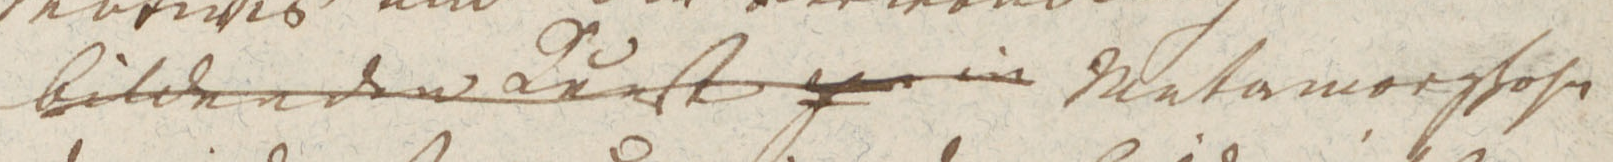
bildenden Kunst in Metamorphose
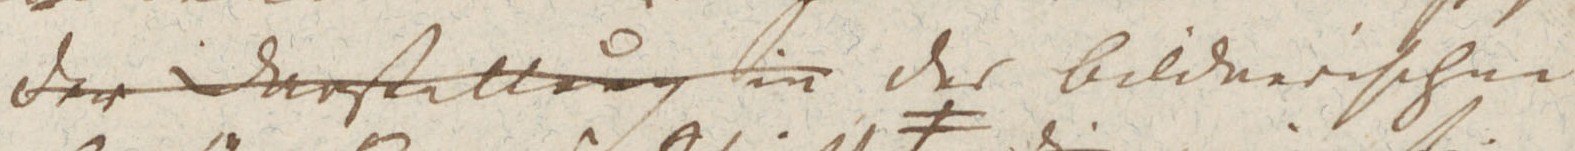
der Darstellung in der bildnerischen
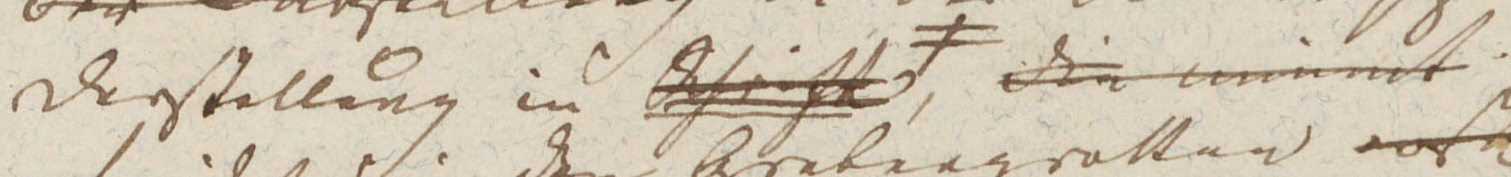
Darstellung in Schrift%, die nimmt
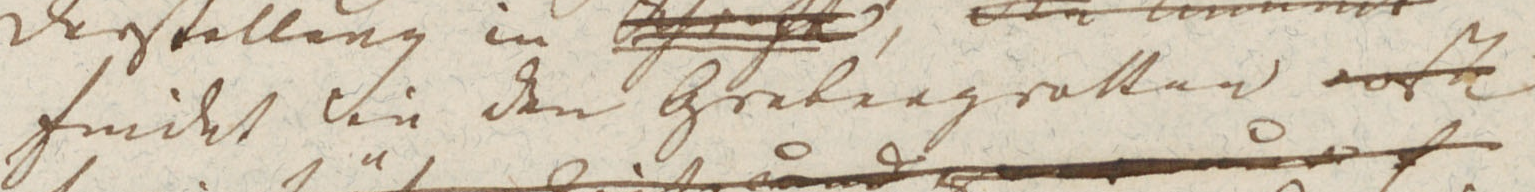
findet in den Grabergrotten erst
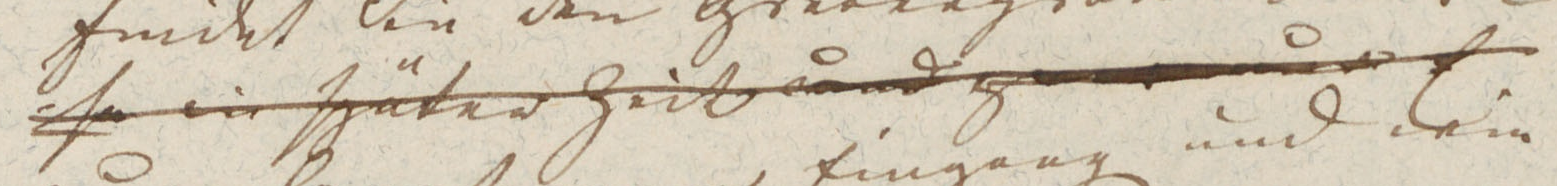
so in später Zeit und zwar nur E
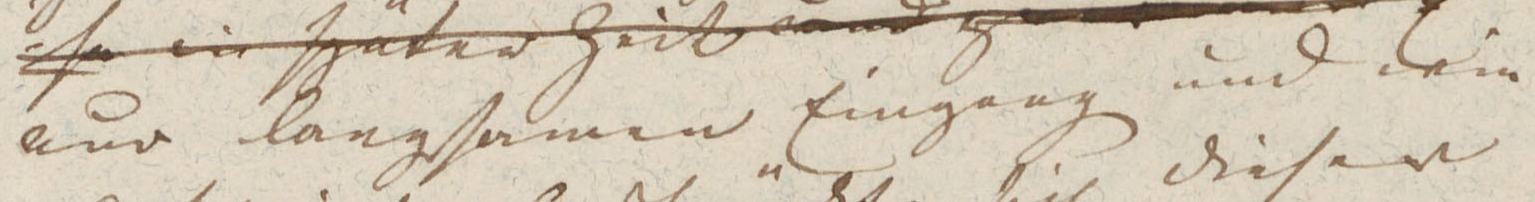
nur langsamen Eingang und wie
